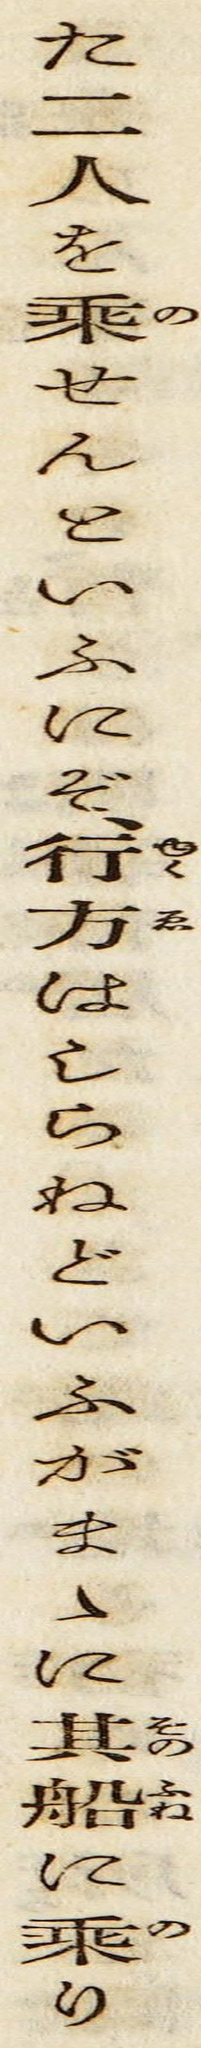た二人を乗せんといふにぞ、行方はしらねどいふがまゝに其船に乗り
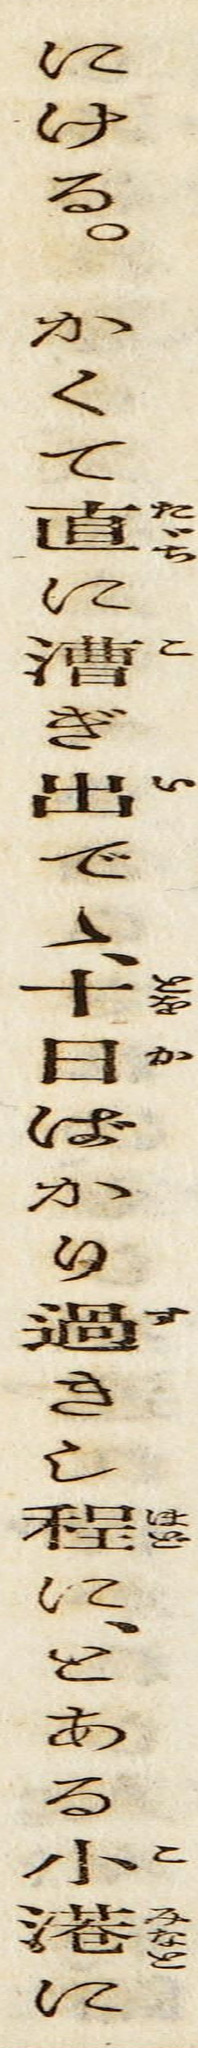にける。かくて直に漕ぎ出でゝ、十日ばかり過きし程に、とある小港に
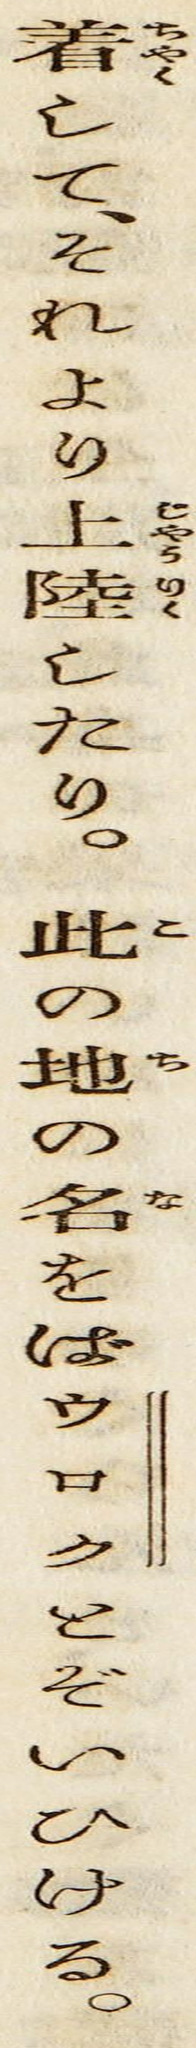着して、それより上陸したり。此の地の名をばウロクとぞいひける。
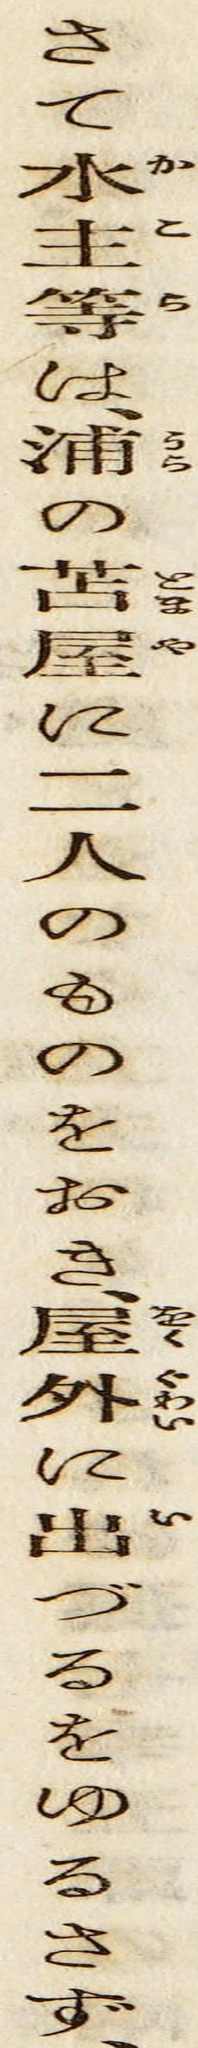さて水主等は、浦の苫屋に二人のものをおき、屋外に出づるをゆるさず、
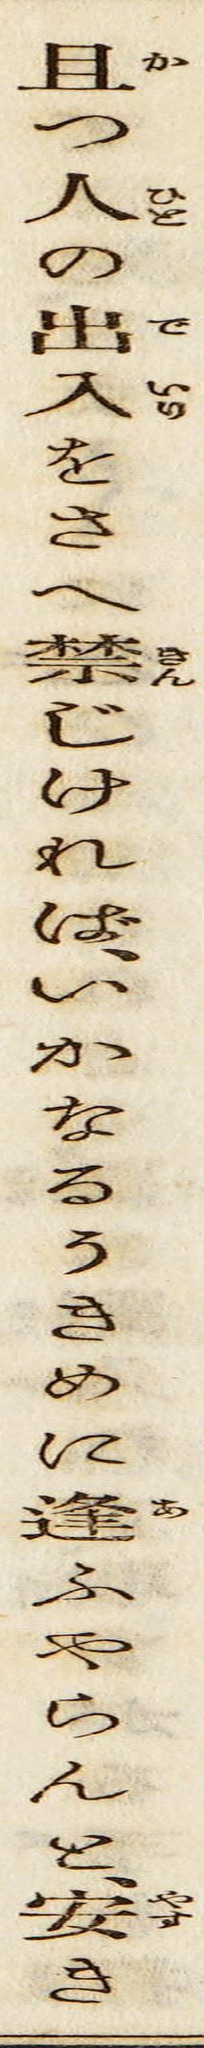且つ人の出入をさへ禁じければ、いかなるうきめに逢ふやらんと、安き
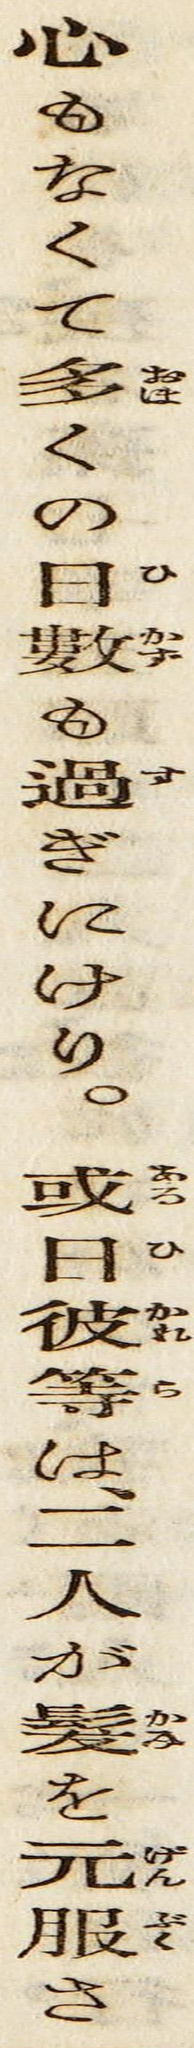心もなくて多くの日数も過ぎにけり。或日彼等は、二人が髪を元服さ
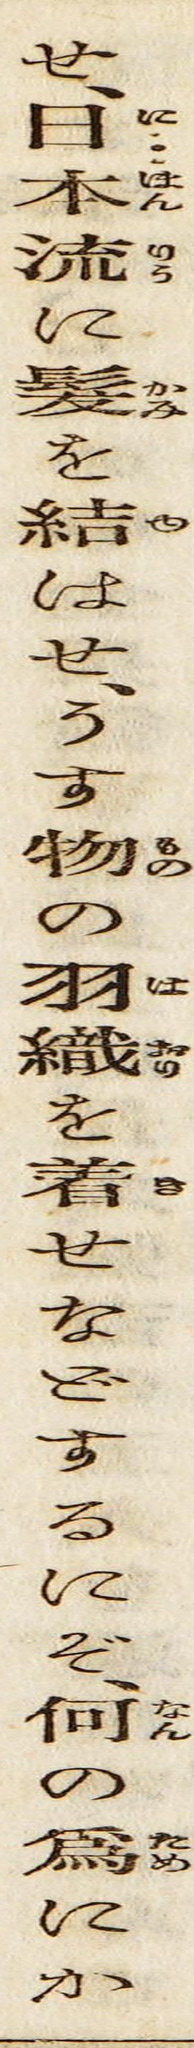せ、日本流に髪を結はせ、うす物の羽織を着せなどするにぞ、何の為にか
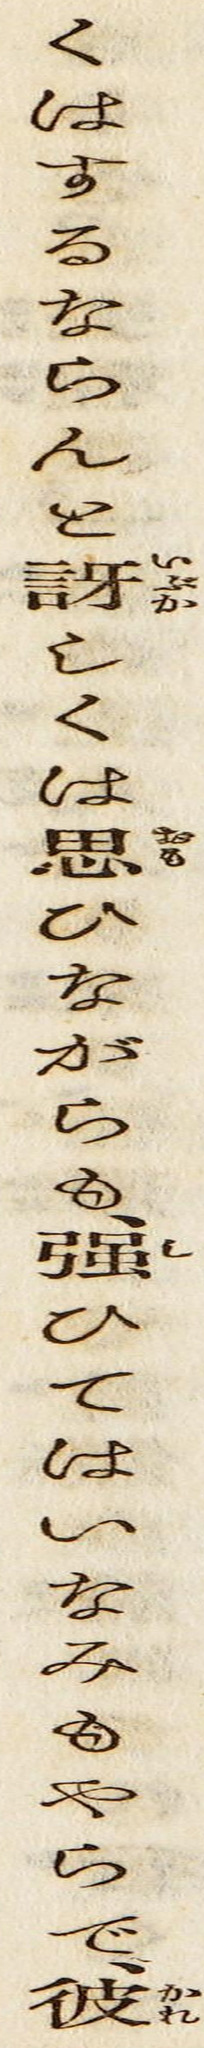くはするならんと訝しくは思ひながらも、強ひてはいなみもやらで、彼
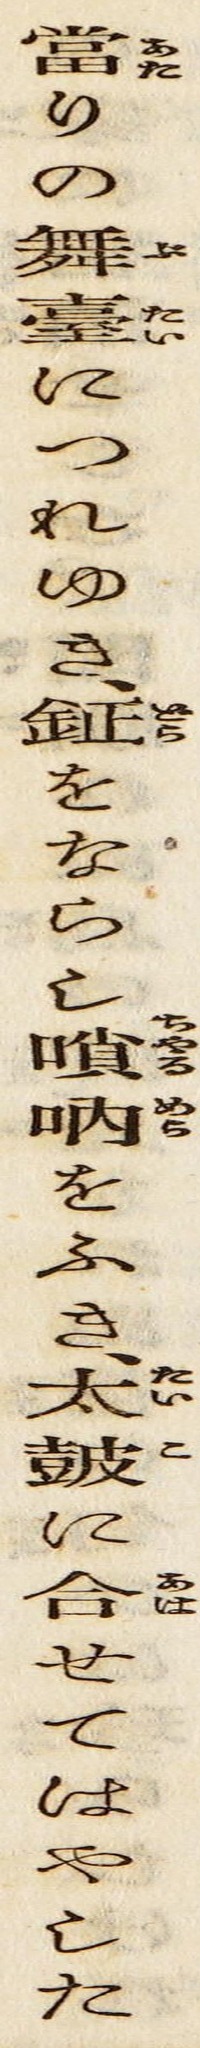当りの舞台につれゆき、鉦をならし嗩吶をふき、太鼓に合せてはやした
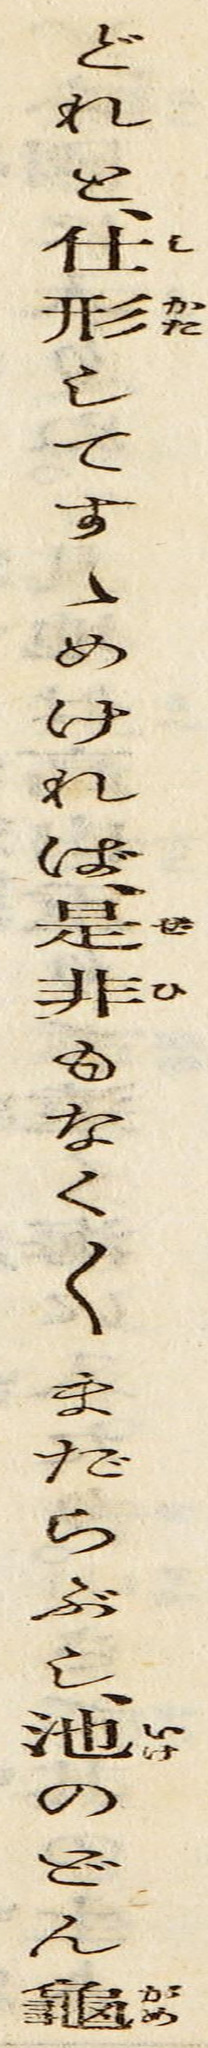どれと、仕形してすゝめければ、是非もなく〳〵まだらぶし、池のどん亀
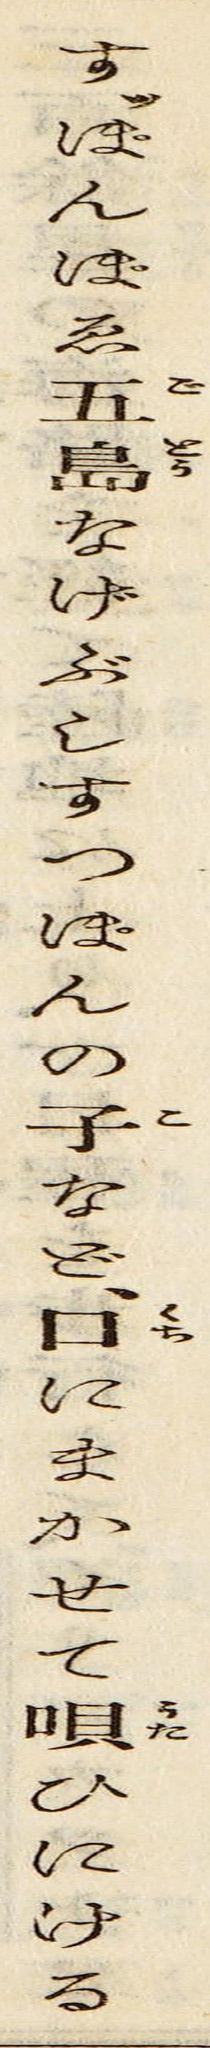すッぽんぽゑ五島なげぶしすつぽんの子など、口にまかせて唄ひにける
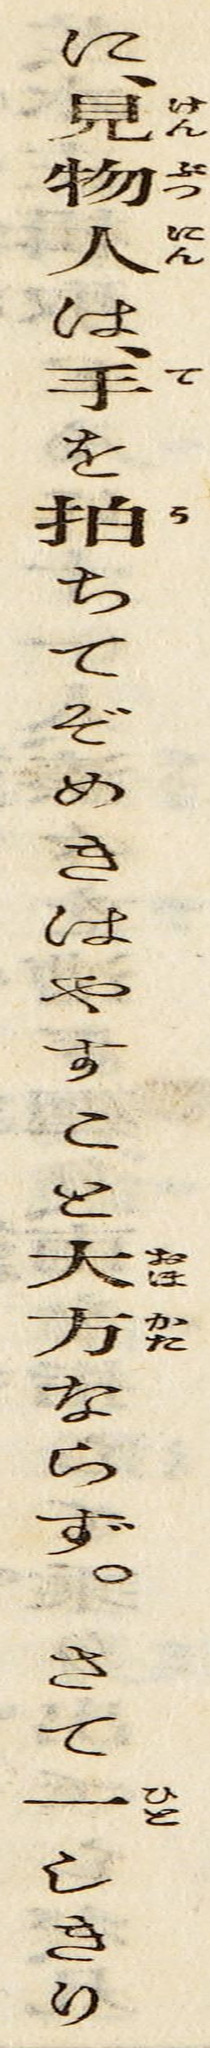に、見物人は、手を拍ちてぞめきはやすこと大方ならず。さて一しきり
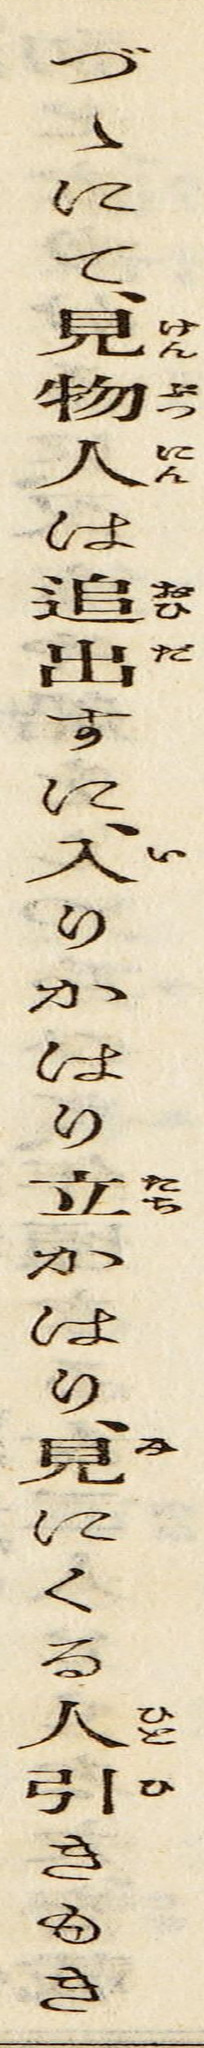づゝにて、見物人は追出すに、入りかはり立かはり、見にくる人引きもき
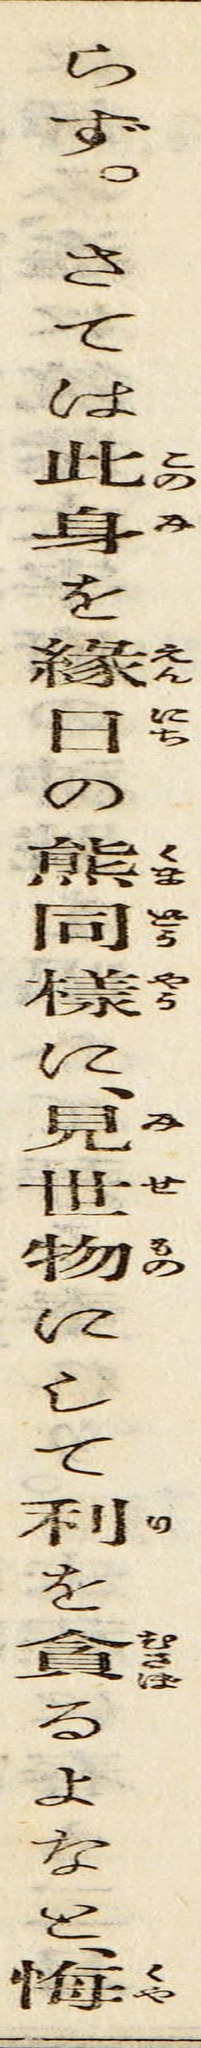らず。さては此身を縁日の熊同様に、見世物にして利を貪るよなと、悔
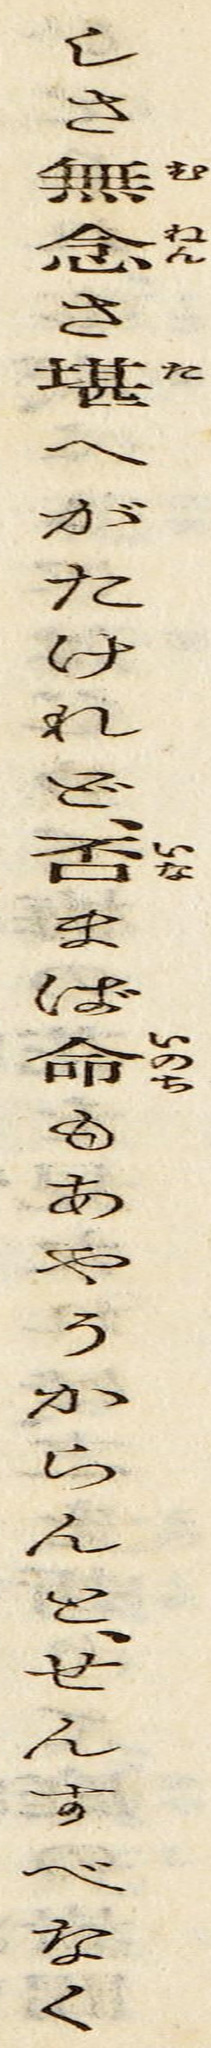しさ無念さ堪へがたけれど、否まば命もあやうからんと、せんすべなく
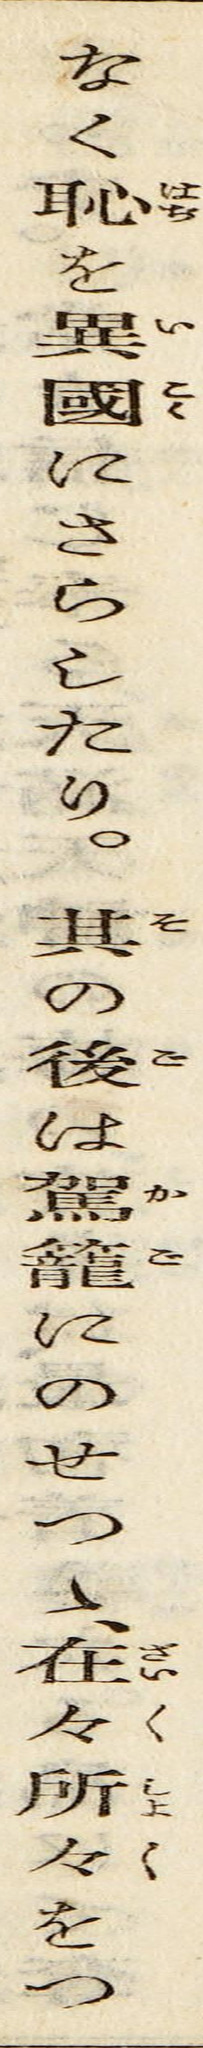なく恥を異国にらしたり。其の後は駕籠にのせつゝ、在々所々をつ
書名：日本漂流譚
